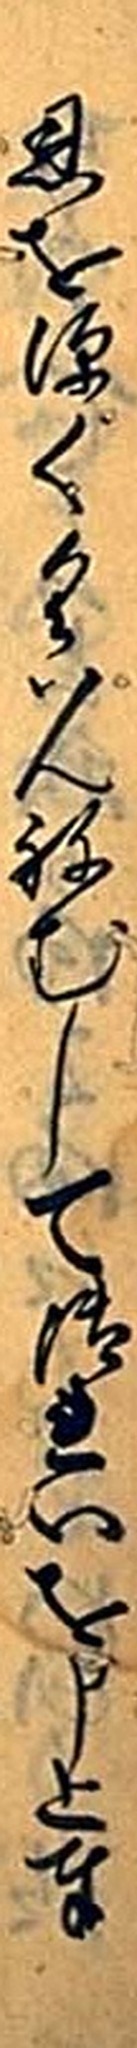恩を深くくはんねむして御れいを申上奉
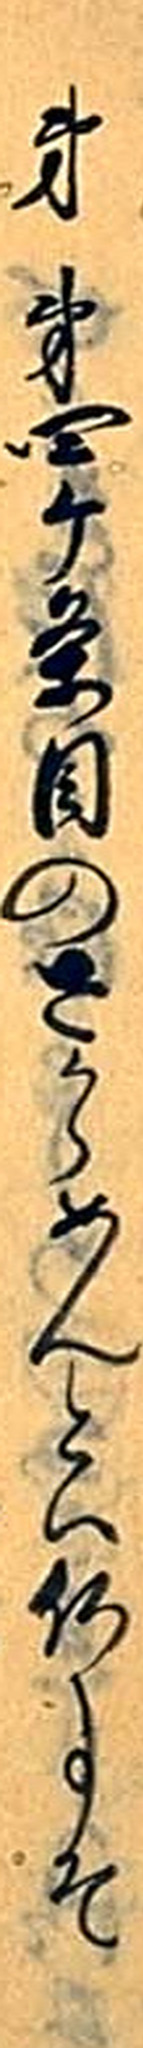弟第四ケ条目のさからめんとは何事そ
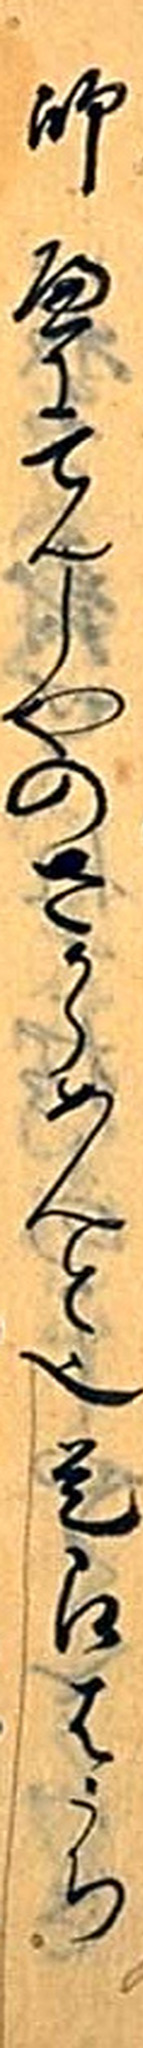師へにてんしやのさからめんと也是即はうち
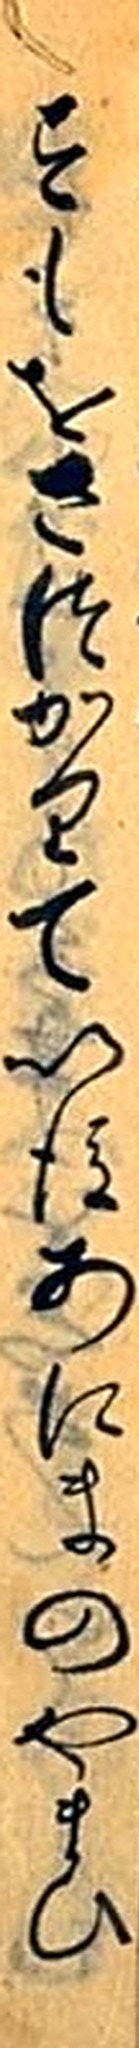すもをさつかりて以後あにまのやまひ
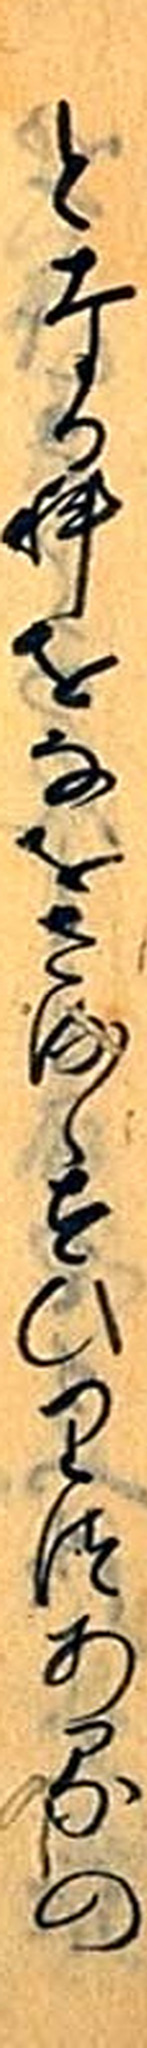となる科をなをさるゝすひりつあるの
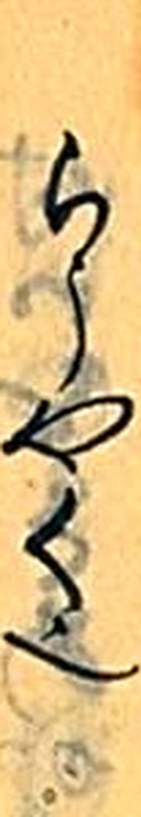らうやく也
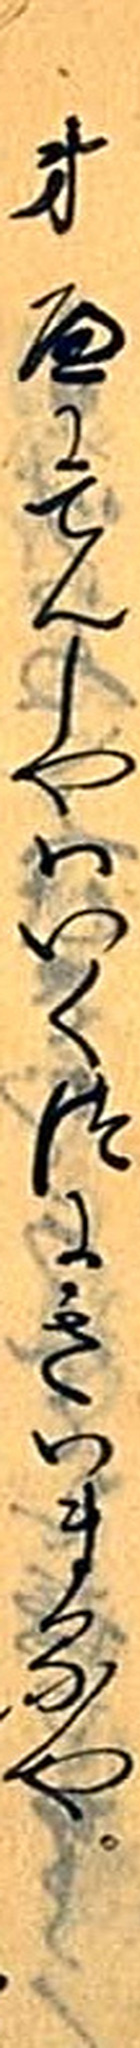弟へにてんしやはいくつにきはまるや
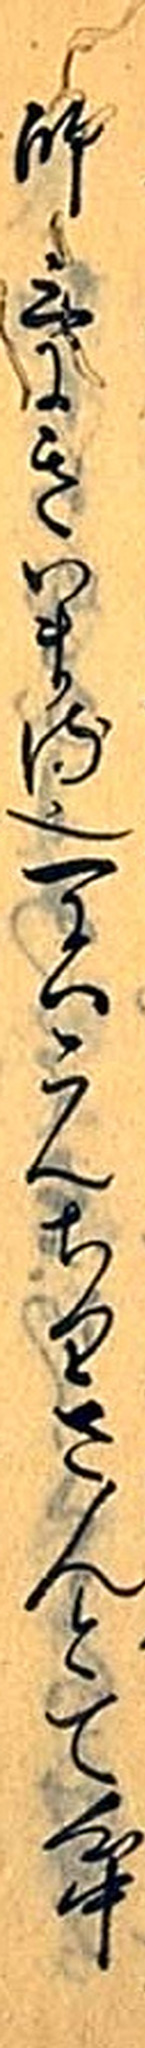師三にきはまる也一にはこんちりさんとて心中
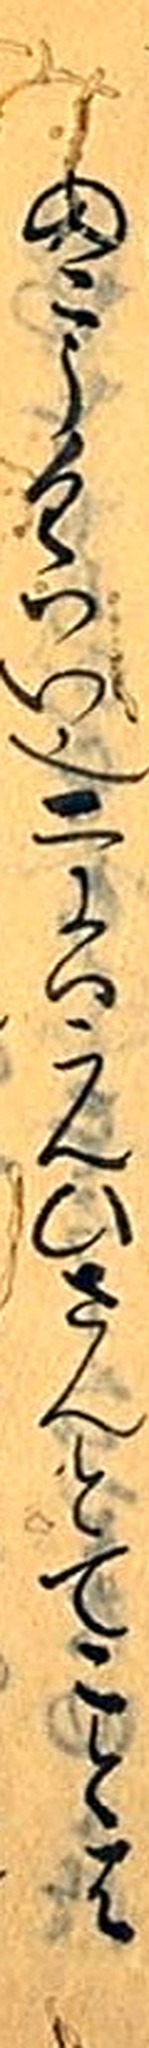のこうくはい也二にはこんひさんとてことは
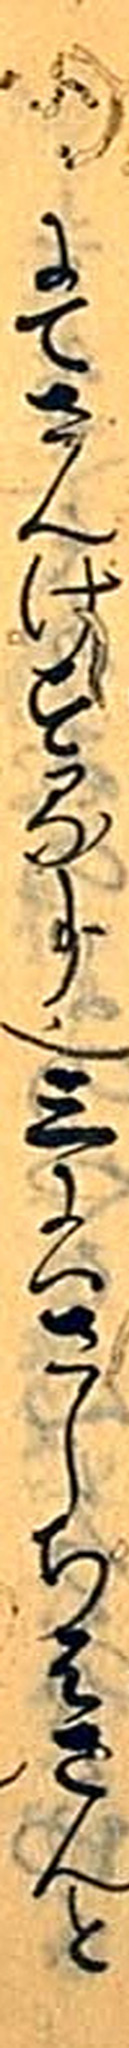にてさんけする事也三にはさしちはさんと
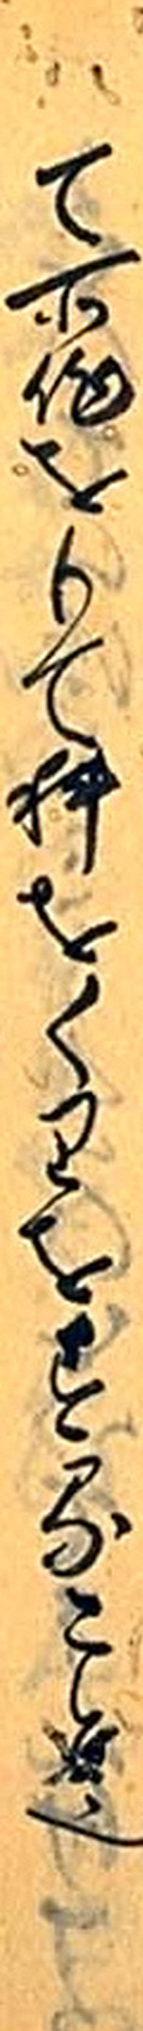て所作をもて科をくりをすること也
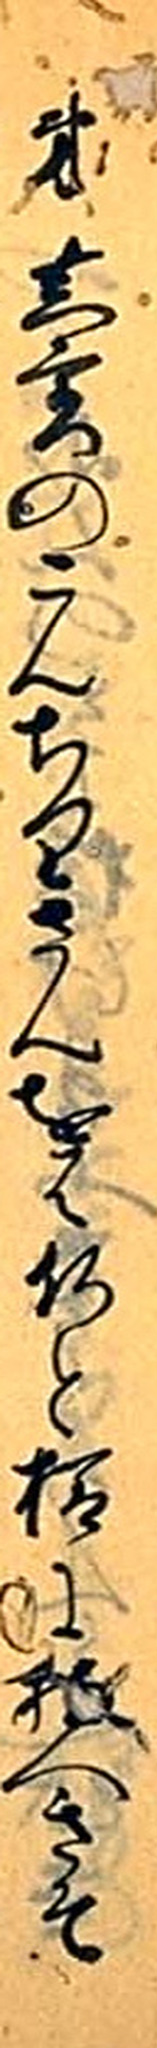弟真実のこんちりさんをは何と様にへきそ
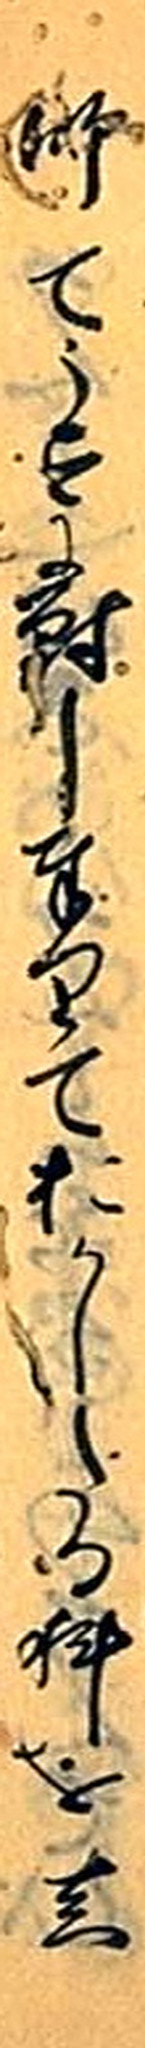師てうすに対し奉りておかしたる科を真
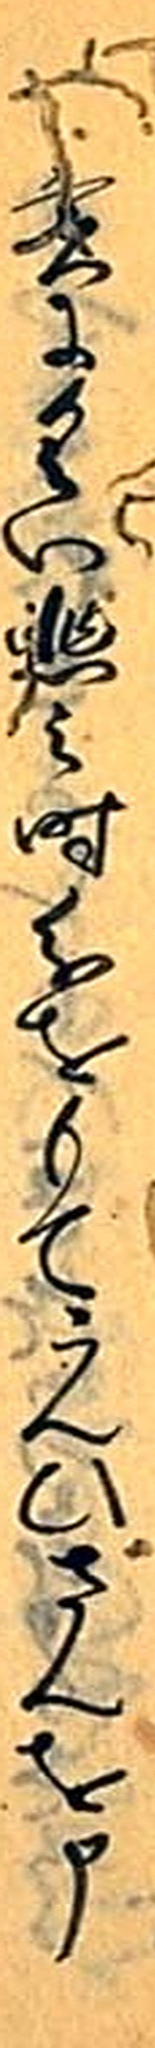実にくい悲み時分をもてこんひさんを申
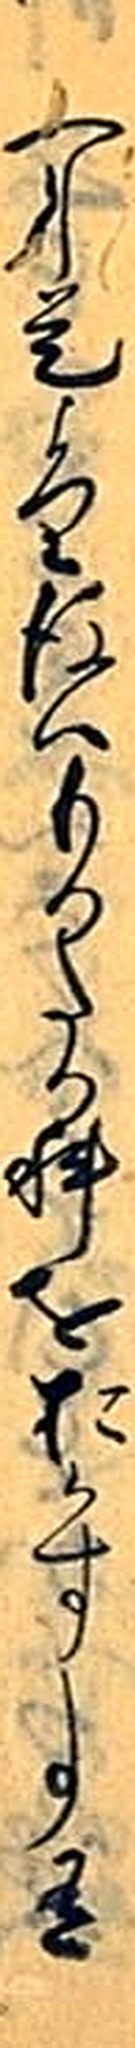へし是より後はもるたる科をおかす事有
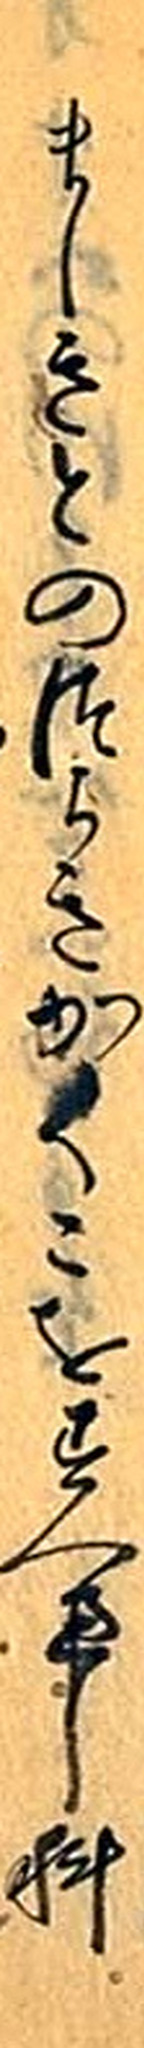ましきとのつよきかくこをすへし科
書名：ドチリナ・キリシタン
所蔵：東京大学総合図書館 / General Library in the University of Tokyo
